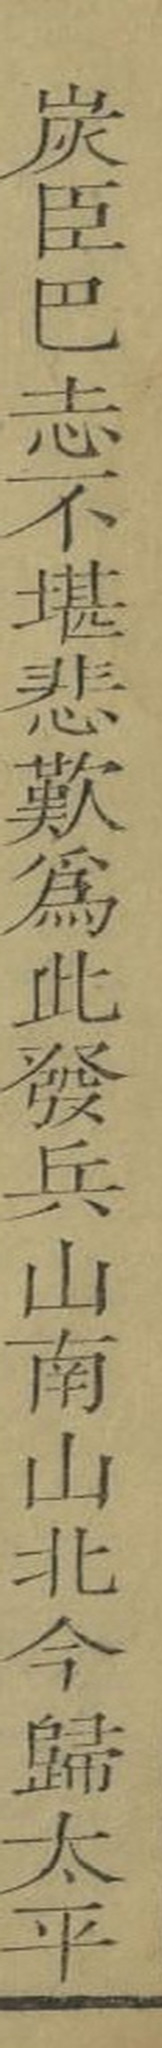炭臣巴志不堪悲歎為此発兵山南山北今帰太平
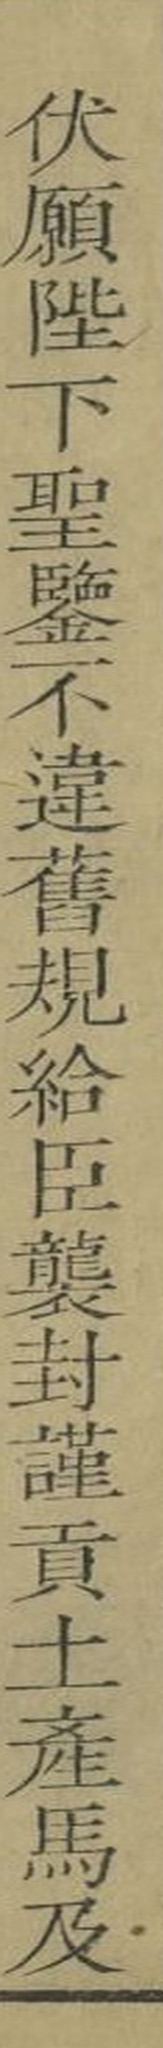伏願陛下聖鑑不違旧規給臣襲封謹貢土産馬及
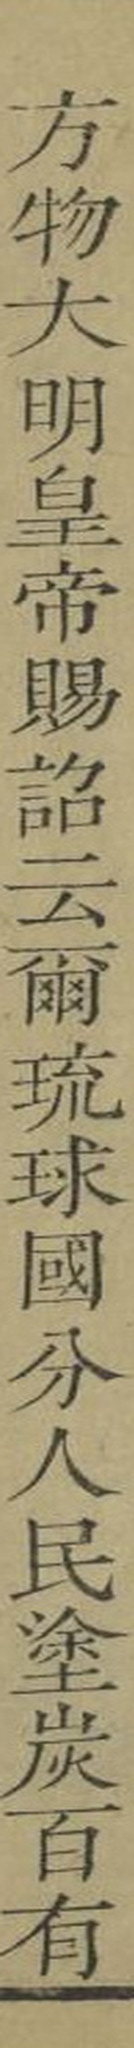方物大明皇帝賜詔云爾琉球国分人民塗炭百有
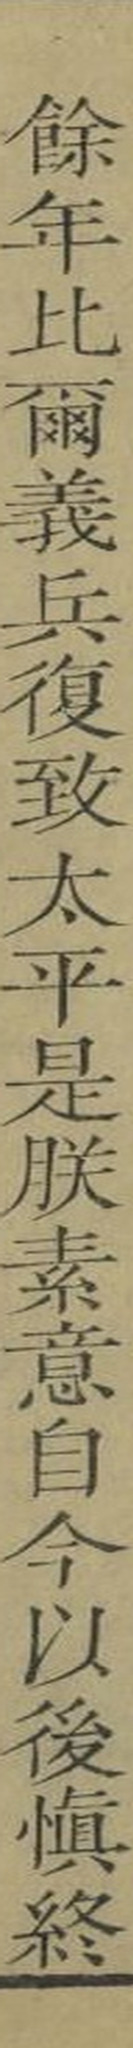余年比爾義兵復致太平是朕素意自今以後慎終
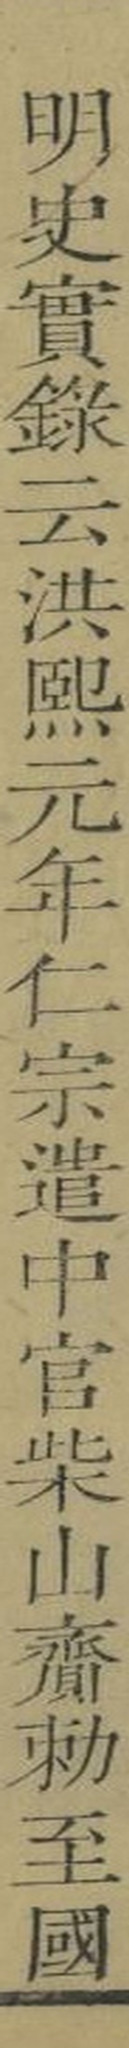明史実録云洪熙元年仁宗遣中官柴山齎勅至国
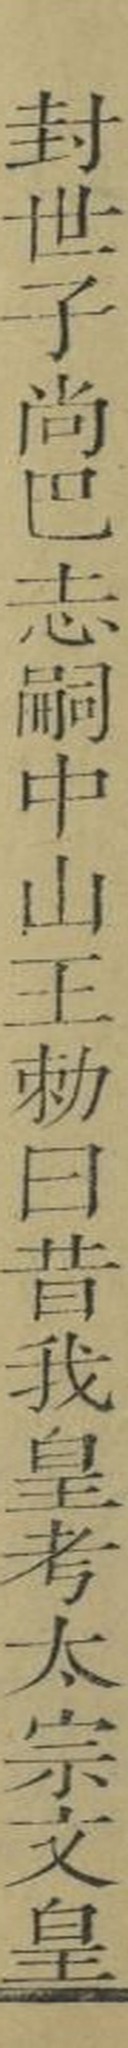封世子尚巴志嗣中山王勅曰昔我皇考太宗文皇
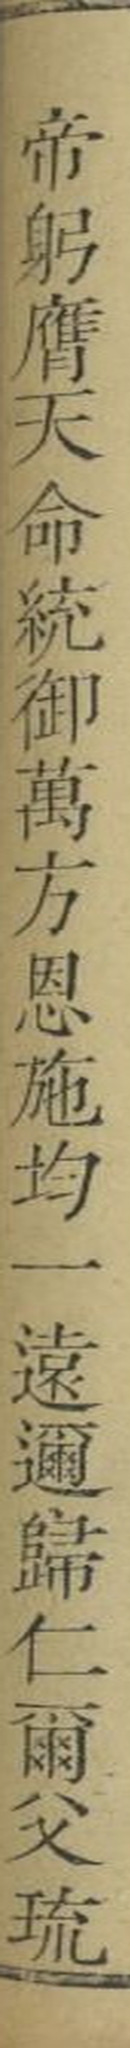帝躬膺天命統御万方恩施均一遠邇帰仁爾父琉
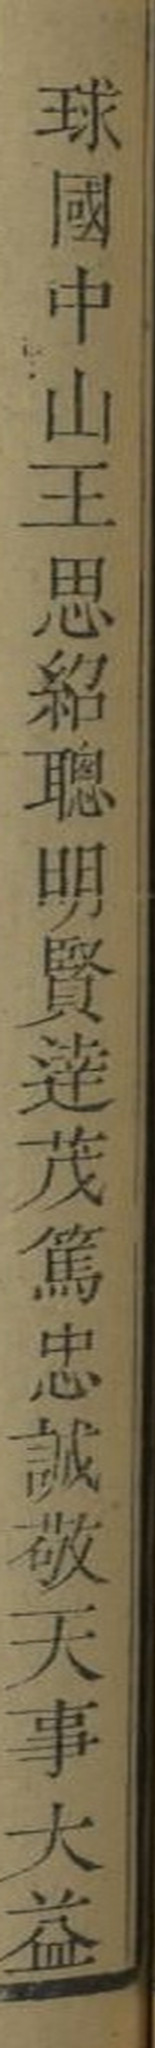球国中山王思紹聡明賢達茂篤忠誠敬天事大益
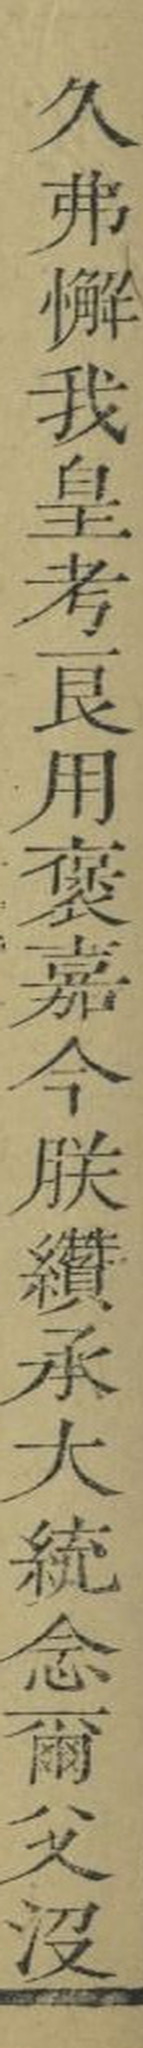久弗懈我皇考良用褒嘉今朕纘承大統念爾父没
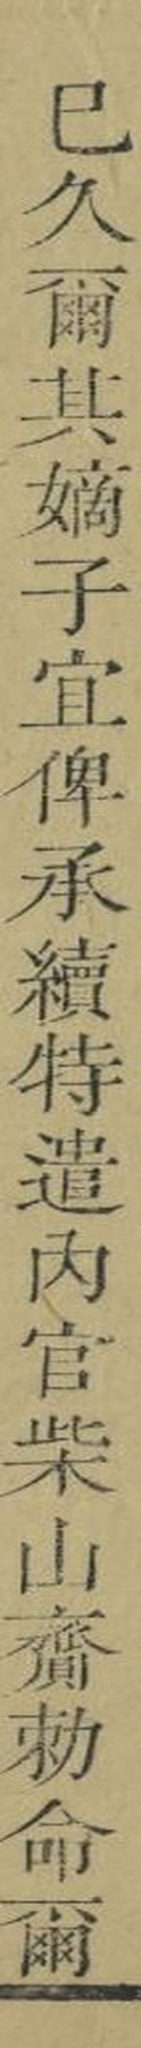巳久爾其嫡子宜俾承続特遣内官柴山齎勅命爾
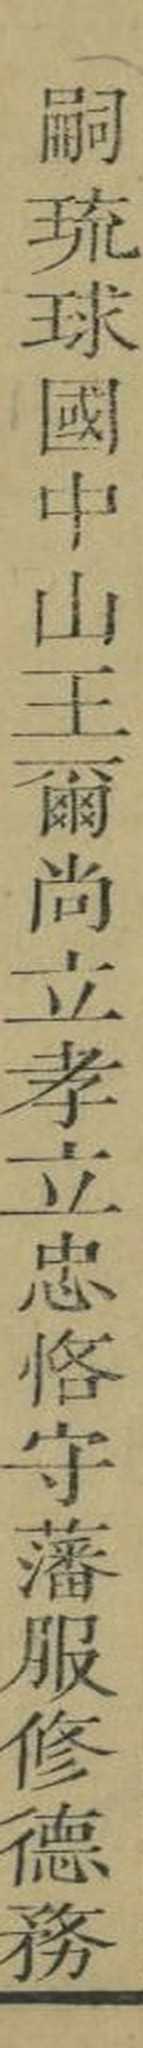嗣琉球国中山王爾尚立孝立忠恪守藩服修徳務
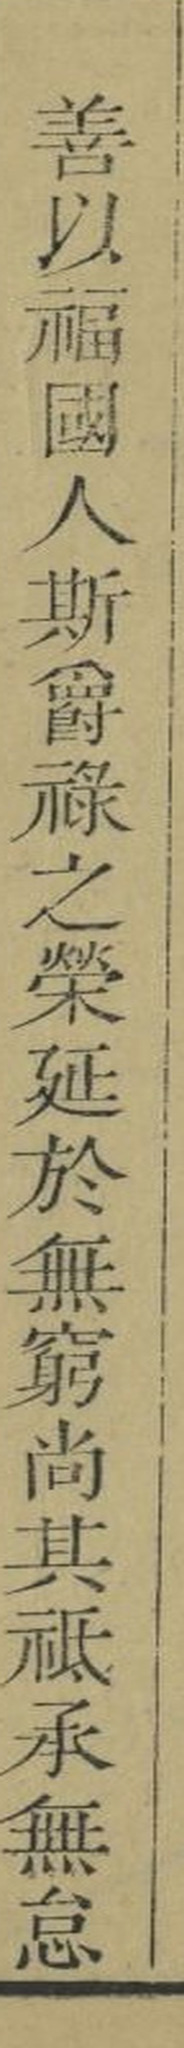善以福国人斯爵禄之栄延於無窮尚其祇承無怠
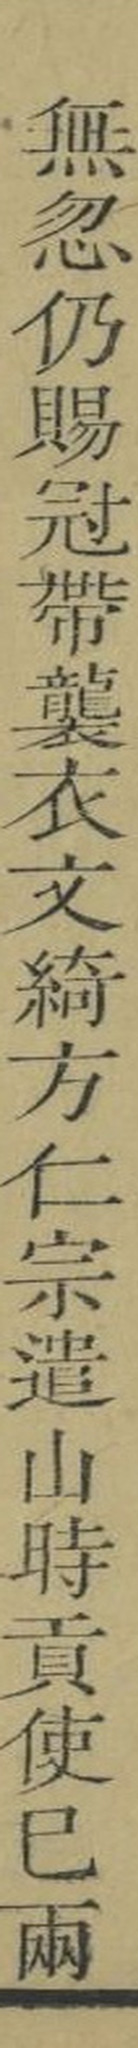無忽仍賜冠帯襲衣文綺方仁宗遣山時貢使巳両
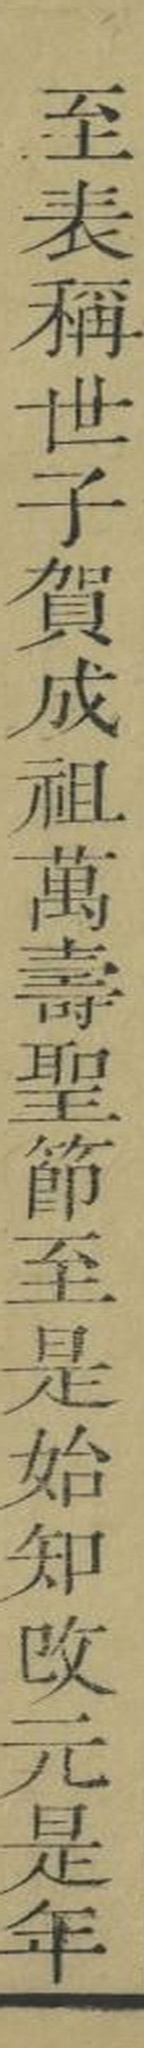至表称世子賀成祖万寿聖節至是始知改元是年
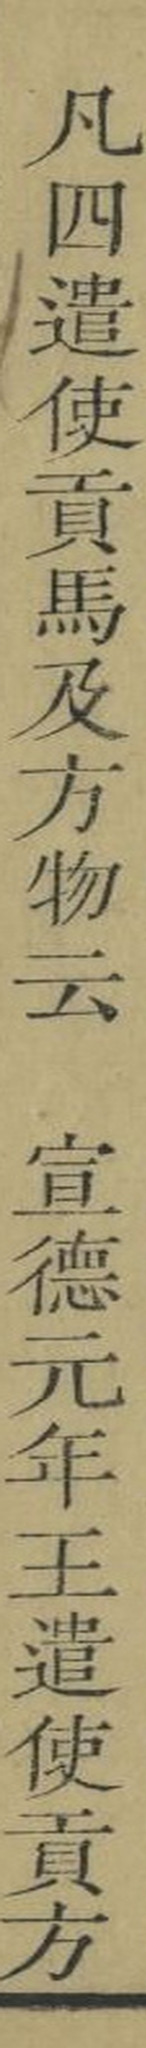凡四遣使貢馬及方物云宣徳元年王遣使貢方
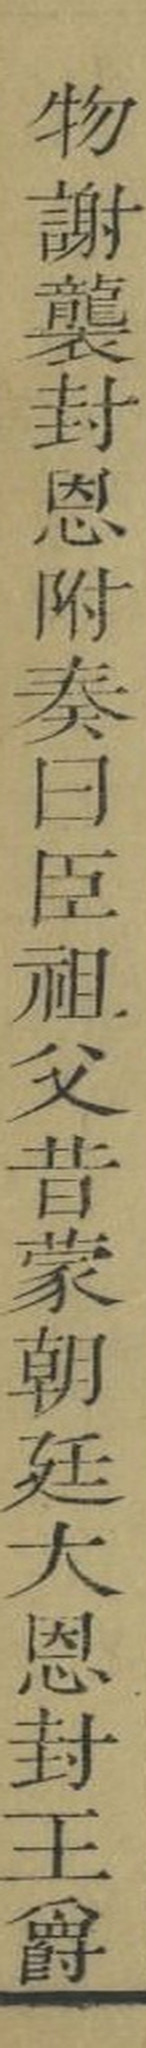物謝襲封恩附奏曰臣祖父昔蒙朝廷大恩封王爵
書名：中山伝信録 巻三
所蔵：University of the Ryukyus Library
